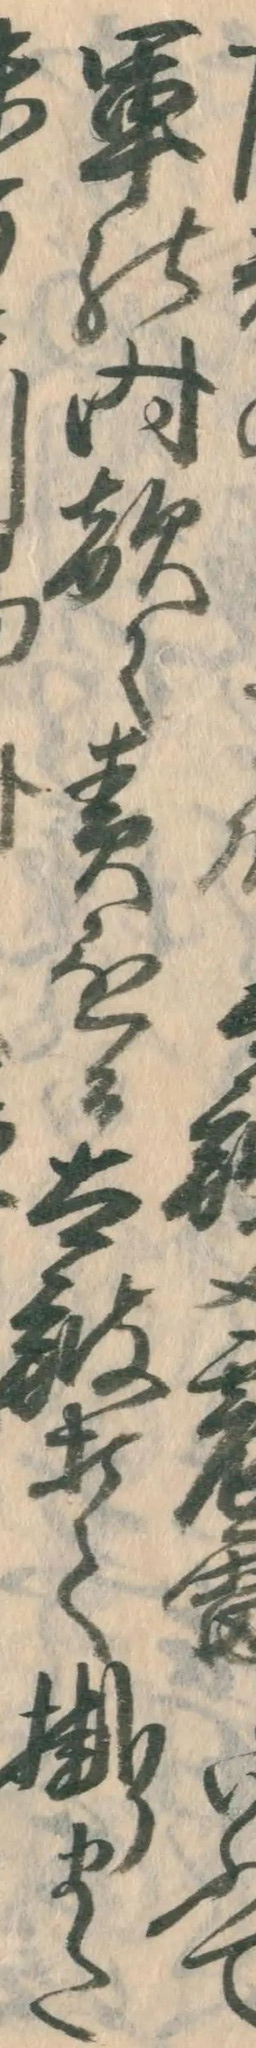軍の時敵に責進而太鼓打て掛りまた
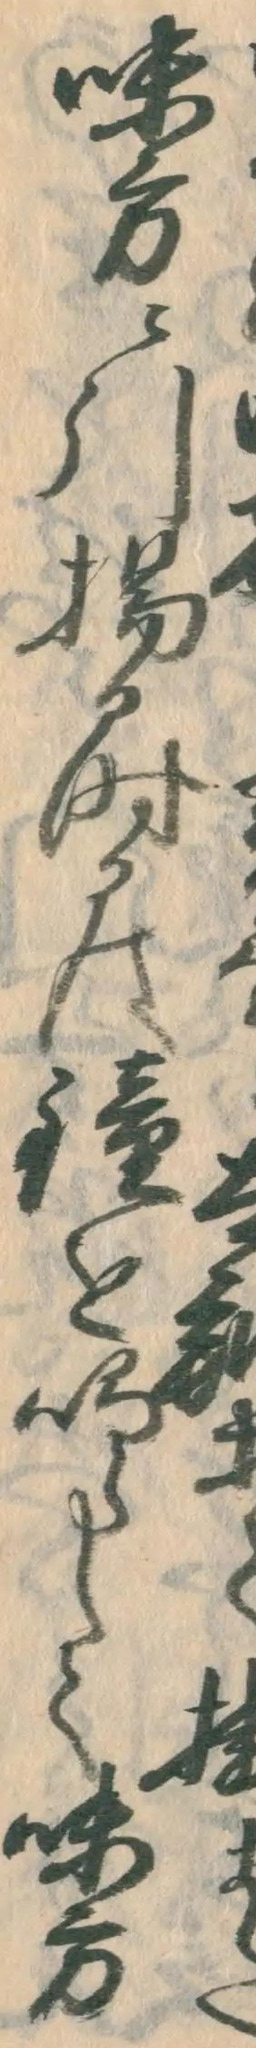味方ニ引揚る時には鐘を鳴らして味方

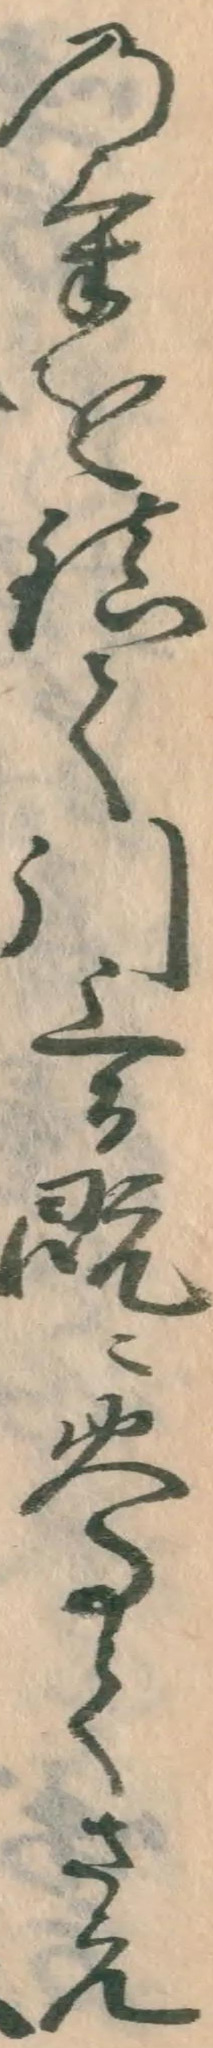の氣を鎮て引上る既ニ火事てさえ
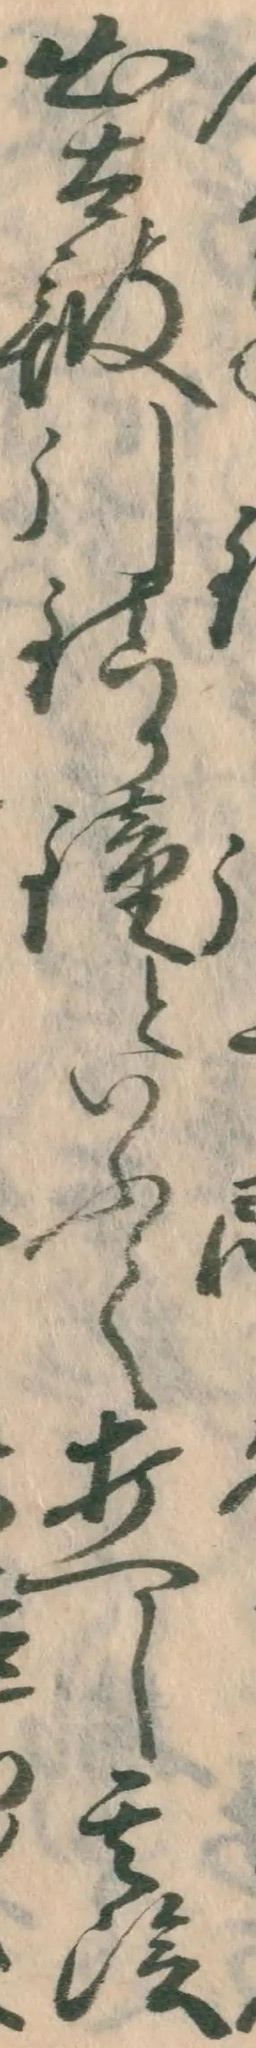出太鼓引鎮り鐘といふて打へし其陰
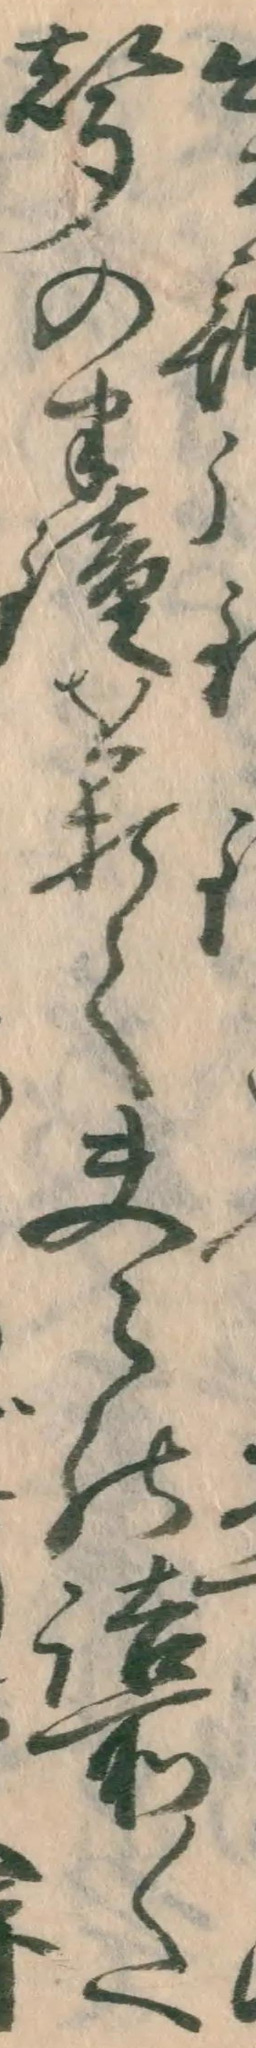聲の半鐘を打て夫々の詰め所〳〵へ
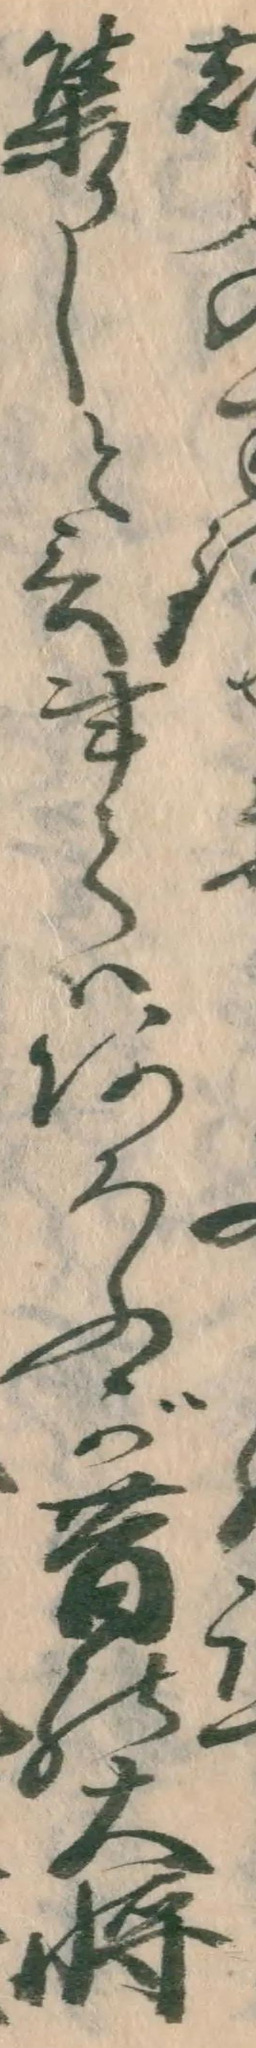集りしと云事てハあろふが昔の大将
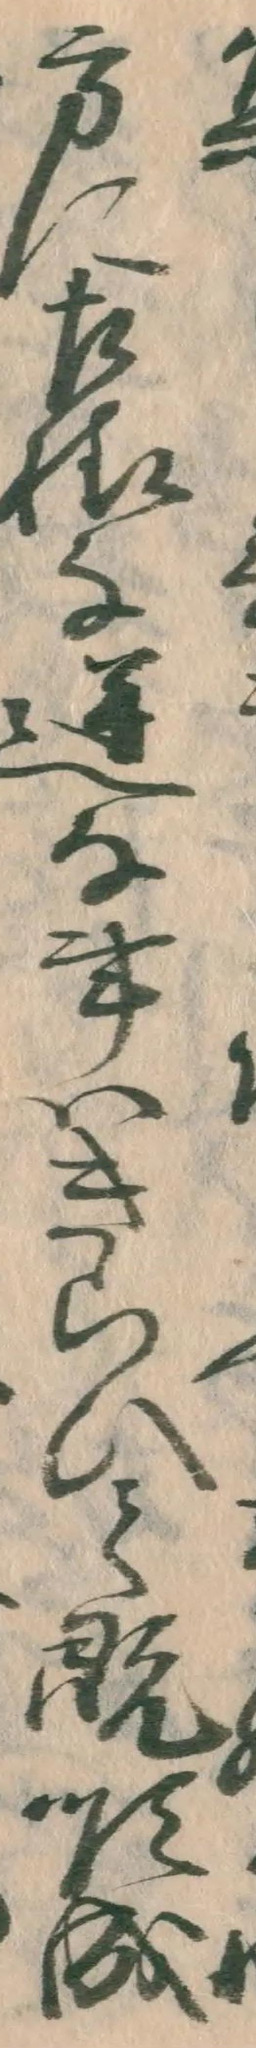方に左様な逆な事ハきらひて既順成
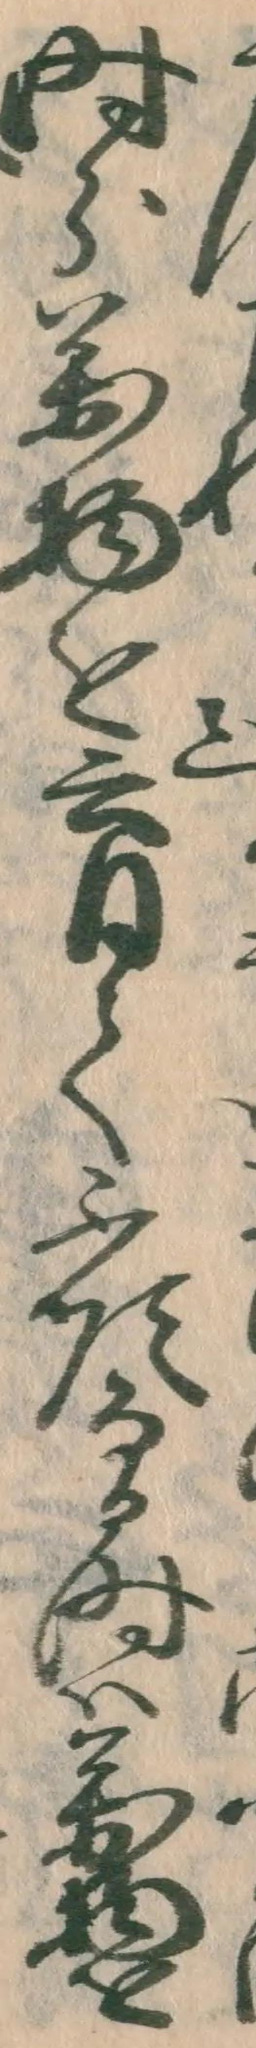時分萬物を育て不順なる時ハ萬物を
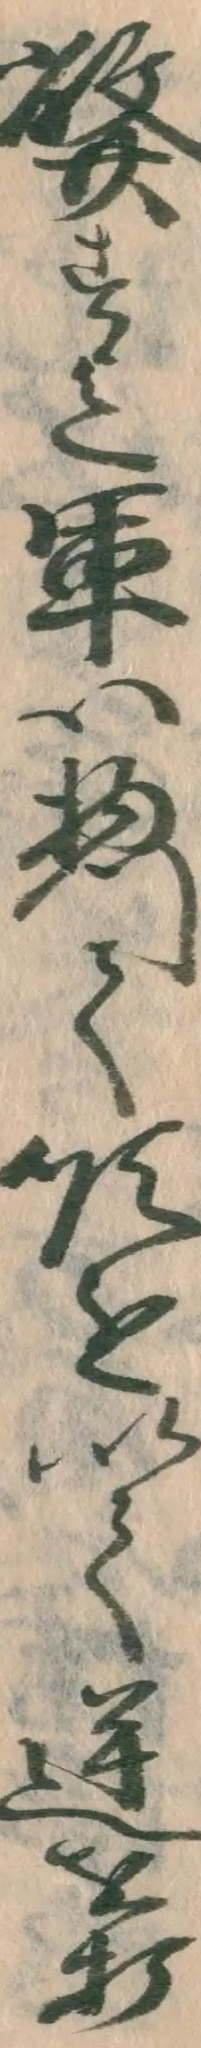弊す迄軍ハ惣して順を以て逆を打
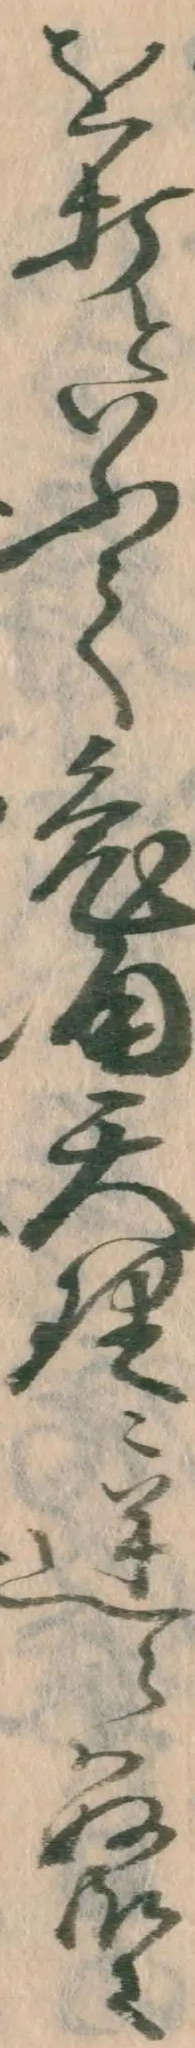を打といふて兎角天理ニ逆らハぬ様に
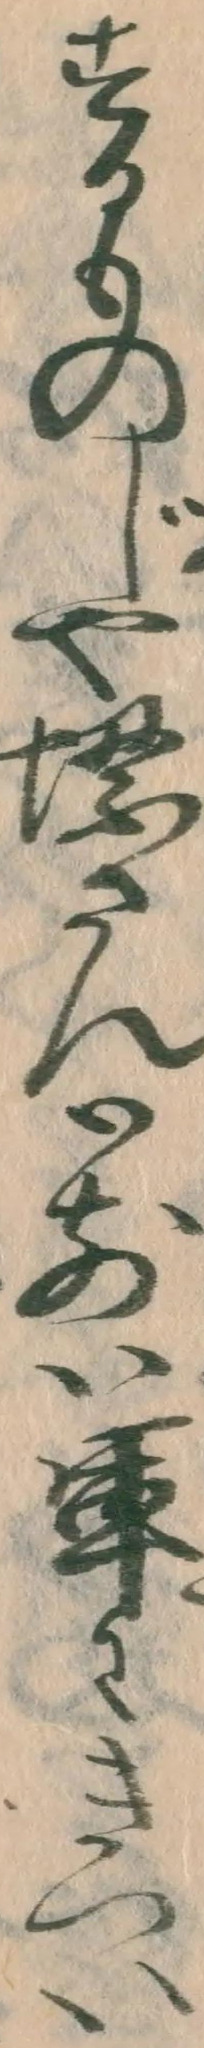するものじや螺さん御前ハ軍にきつい
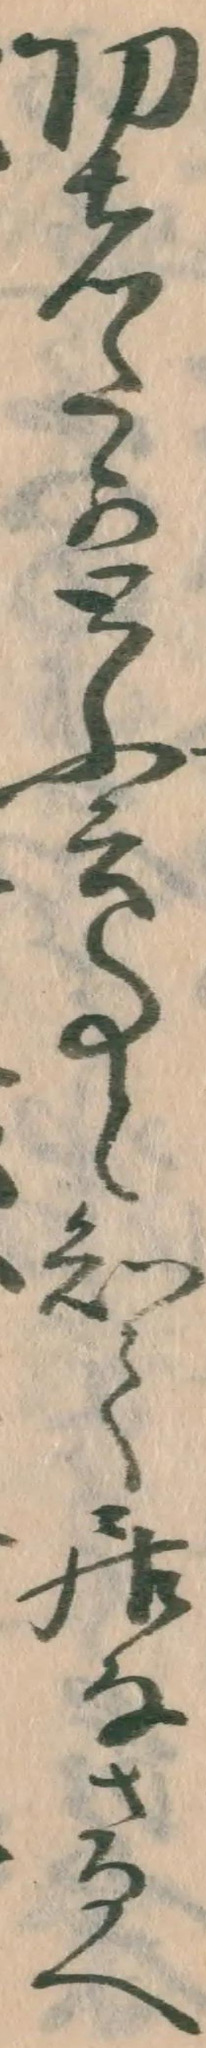功者たかとふ云事と知て居なさるへ
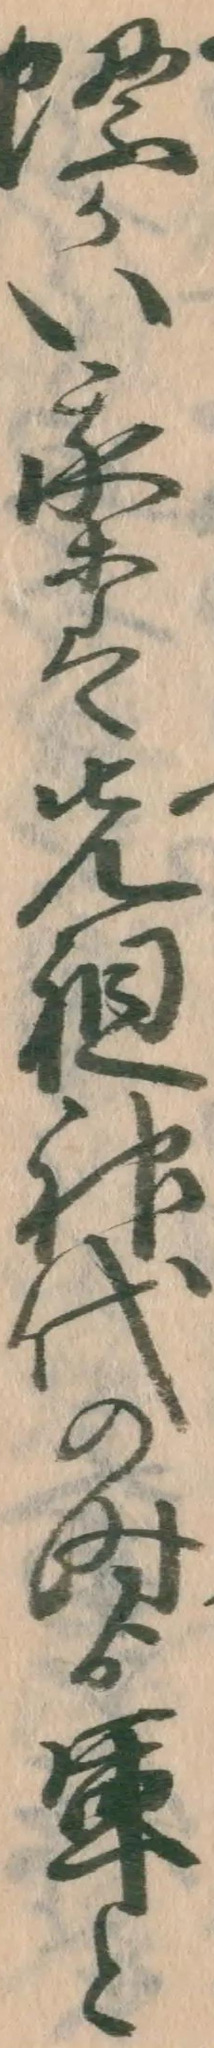螺かい我等は先祖神代の時ゟ軍と
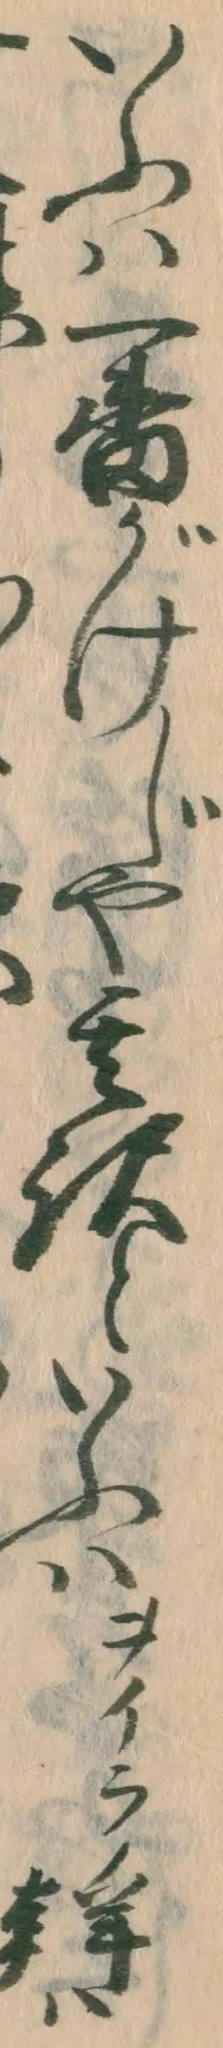いふハ一番がけじや其訳といふハヲイラノ聲ハ
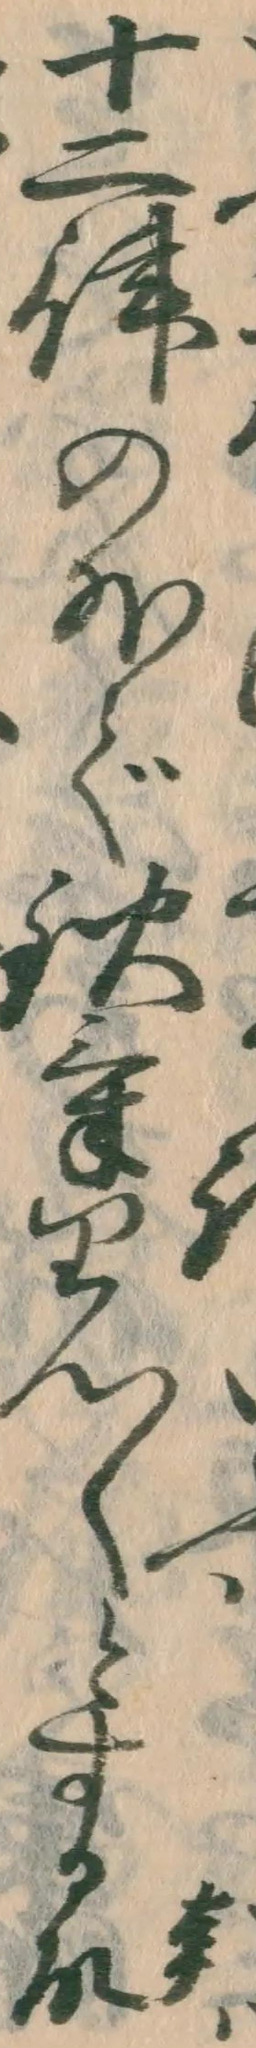十二律の外で秋氣りん〳〵とする処
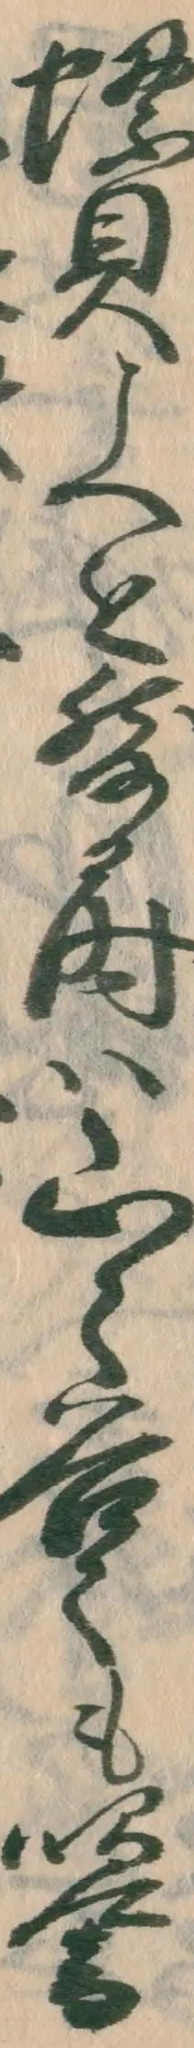螺貝こえを発る時ハ山々谷々も鳴響
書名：麗斎叢書. 20
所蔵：国立国会図書館 National Diet Library, JAPAN
